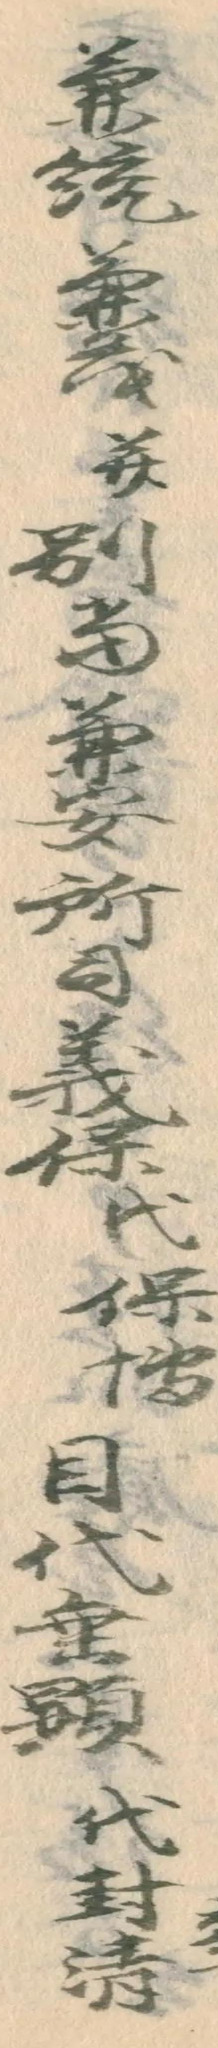兼統兼茂并別当兼安所司義保代保博目代垂顕代封清
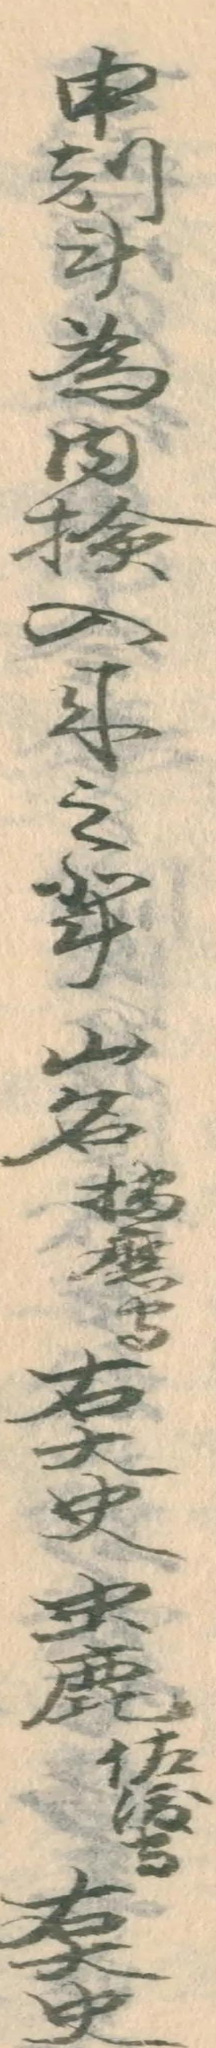一申刻計為内検入来之輩山名播磨守右大史虫鹿佐渡守右大史

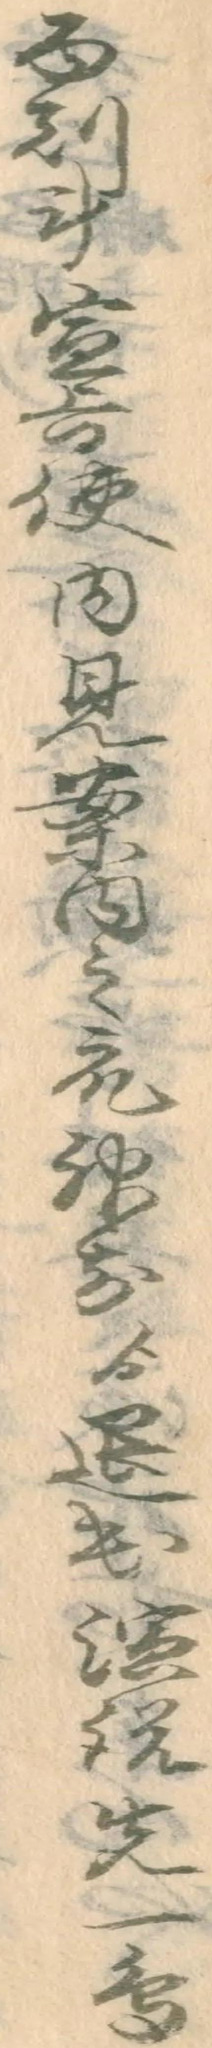一酉刻計宣旨使内見案内之衆神前ゟ退出演説先一鳥
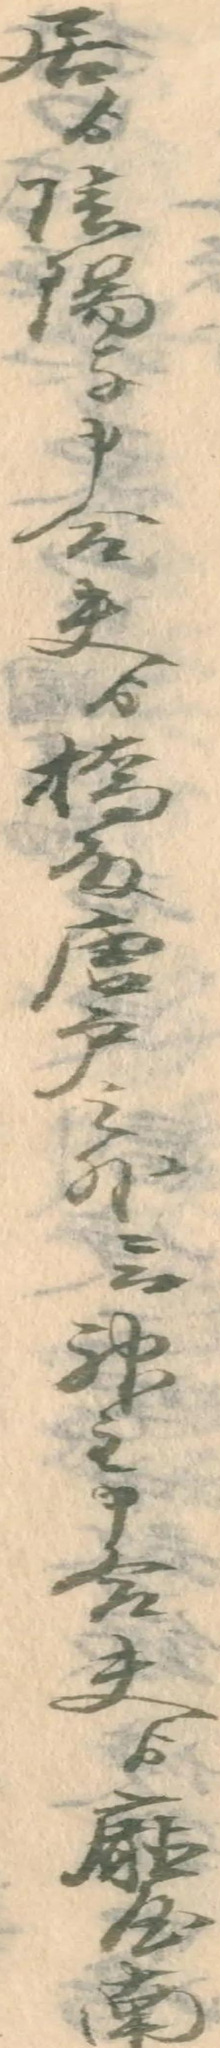居ゟ陰陽与申合夫ゟ橋殿唐戸之外ニ而神主申合夫ゟ庁屋南
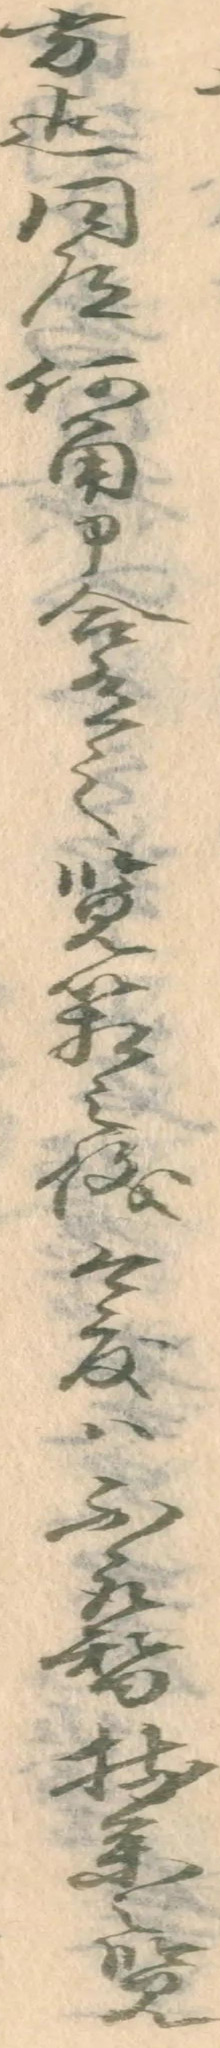方迄同道何角申合有之覧箱之儀今度ハ不取替持参之覧
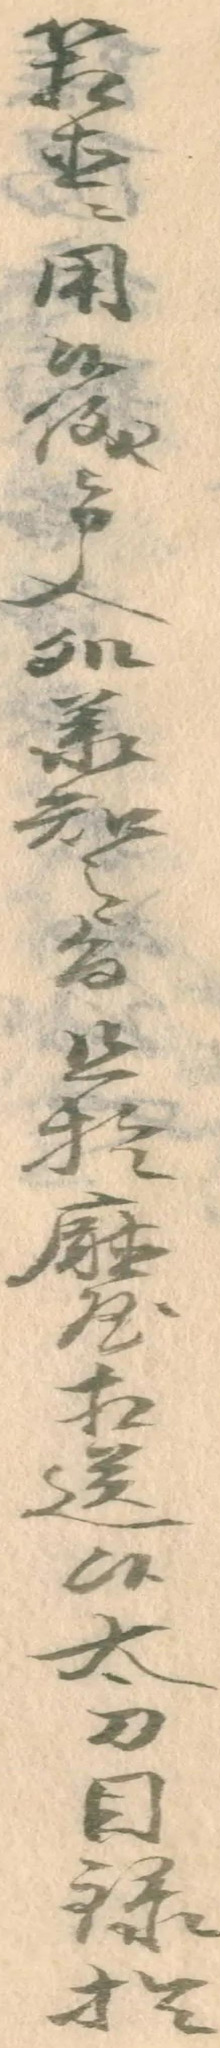箱直ニ用候儀被申入処承知之旨且於庁屋相送候太刀目録於
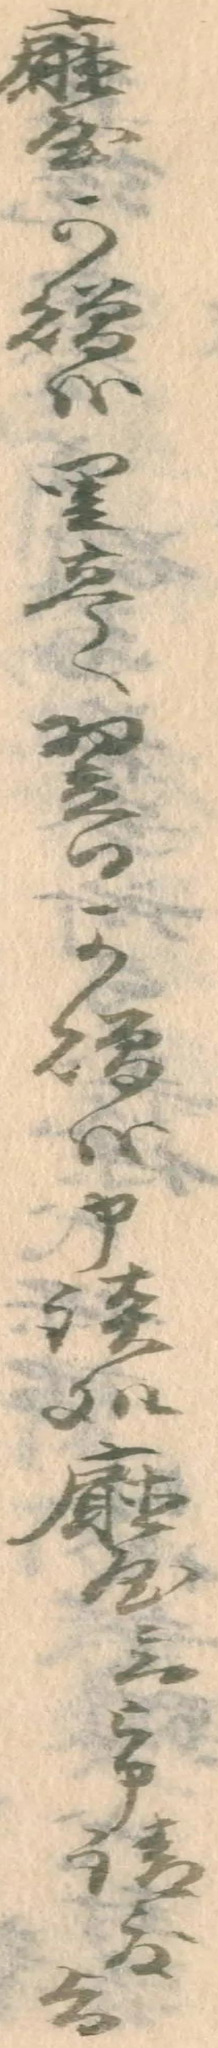庁屋可贈哉里亭へ翌日可贈哉申談処庁屋ニ而被申請度旨
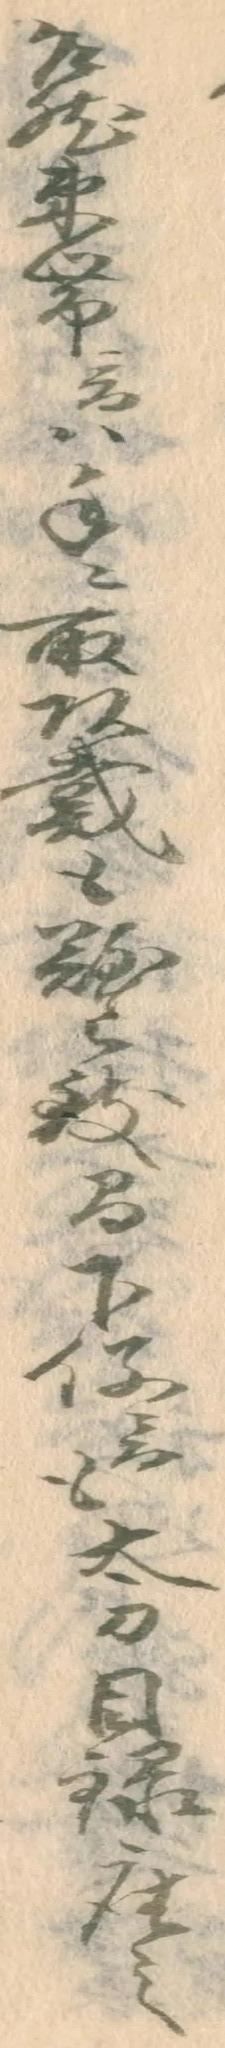乍然束帯ニ而ハ手ニ取頂戴も難被致間下役ニ而も太刀目録座之
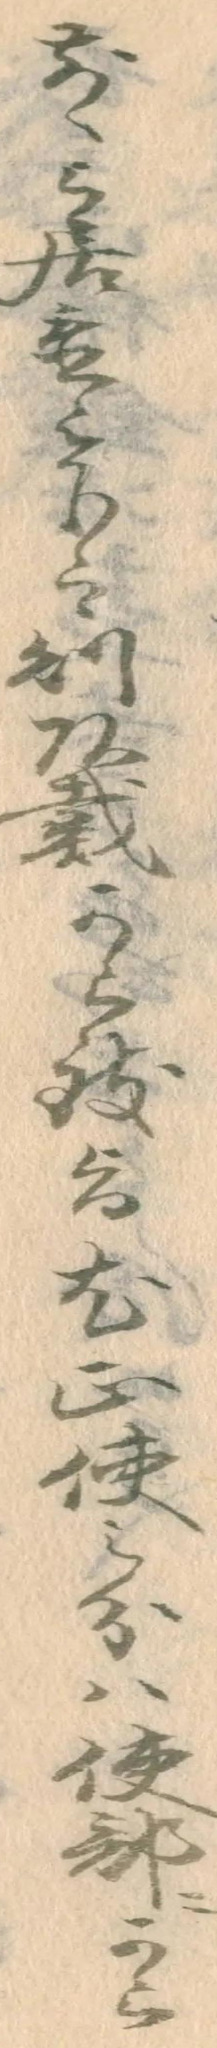前へ被居置被下候ハヽ則頂戴可被致旨尤正使之分ハ使部ニ可被
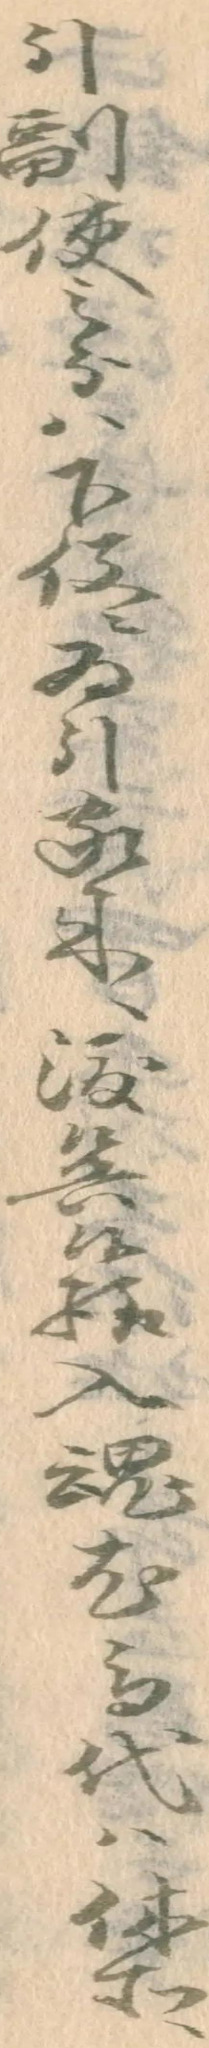引副使之分ハ下役ニ為引家来へ渡呉候様入魂尤高代ハ休所へ
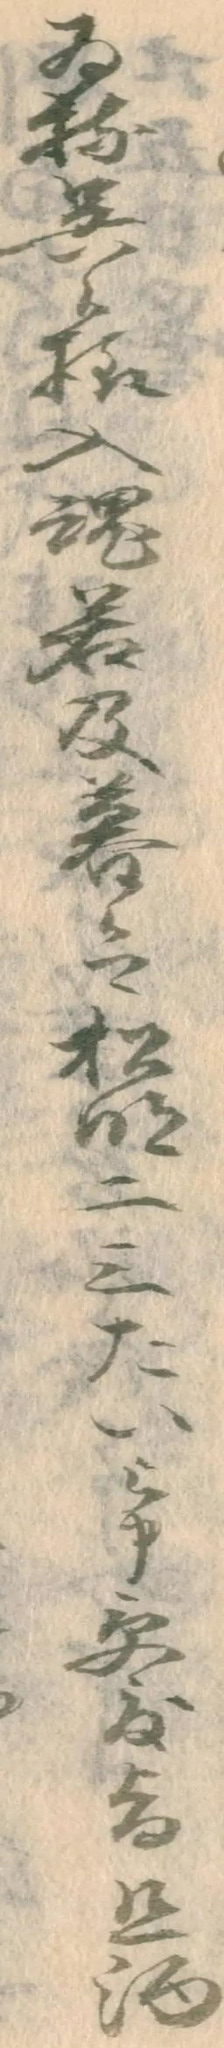為持呉候様入魂若及暮候ハヽ松明二三たい被申受度旨且酒
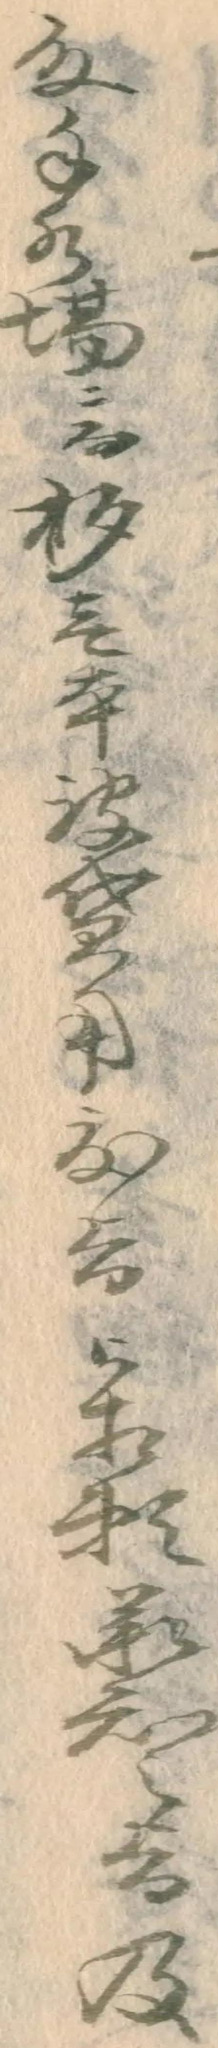殿手水場ニ而杓壱本被貸用度旨被相頼承知候旨及
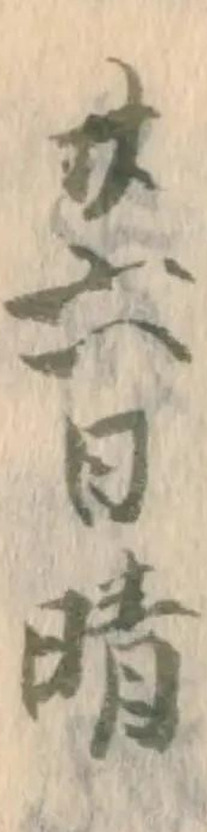廿六日晴
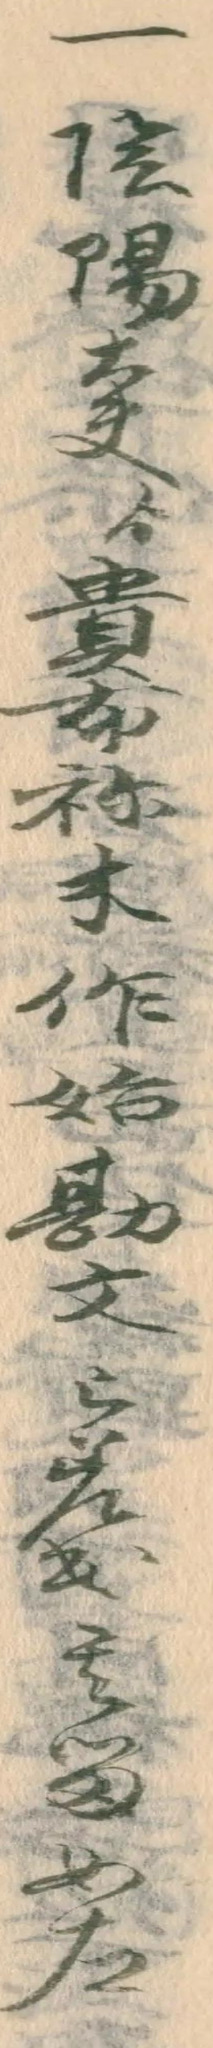一陰陽大夫ゟ貴布祢木作始勘文被差出其留如左
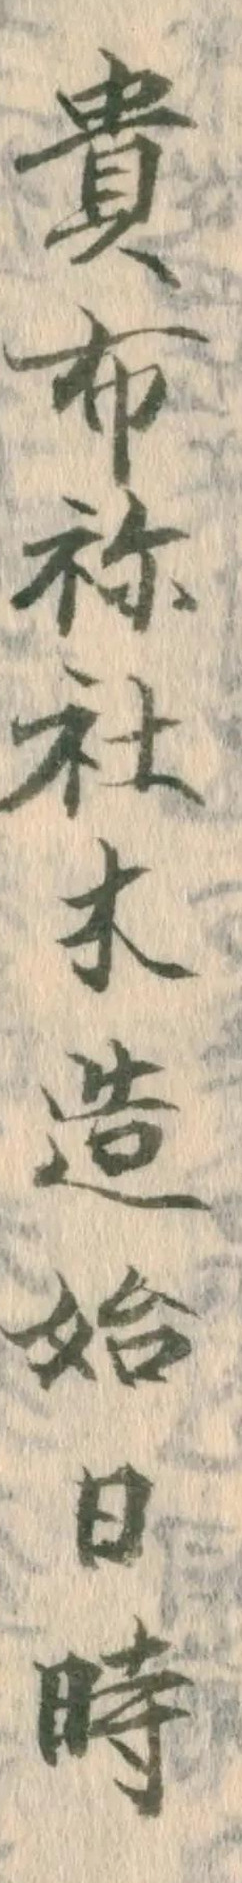貴布祢社木造始日時
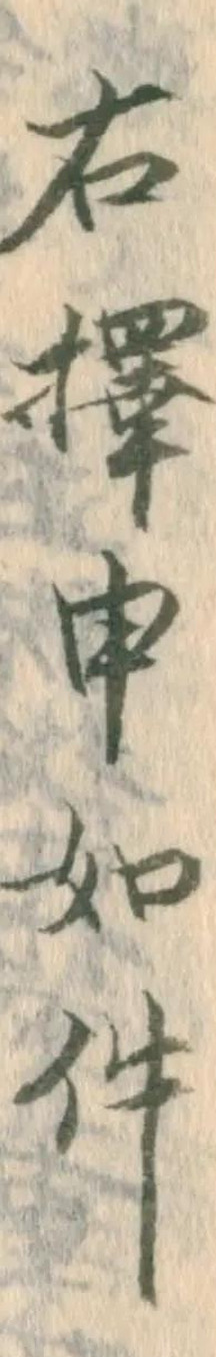右択申如件
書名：賀茂社記録. 第17冊
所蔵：国立国会図書館 National Diet Library, JAPAN
